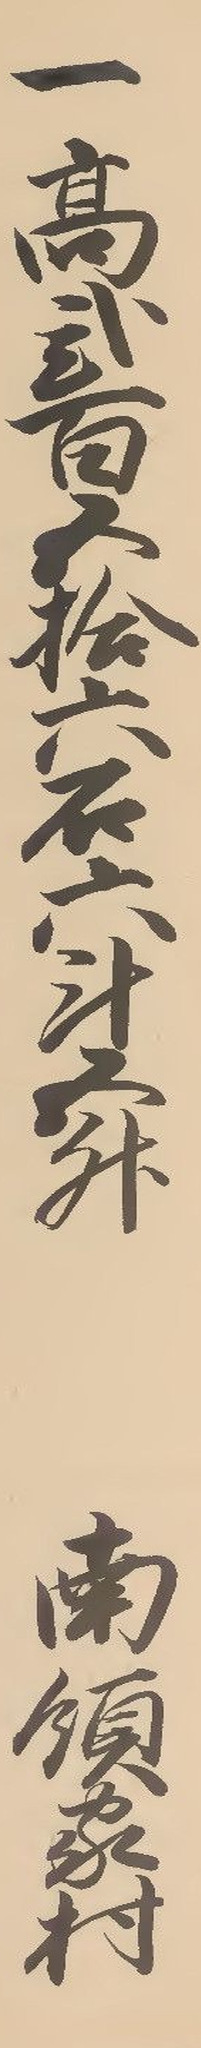一高弐百五拾六石六斗五升南領家村
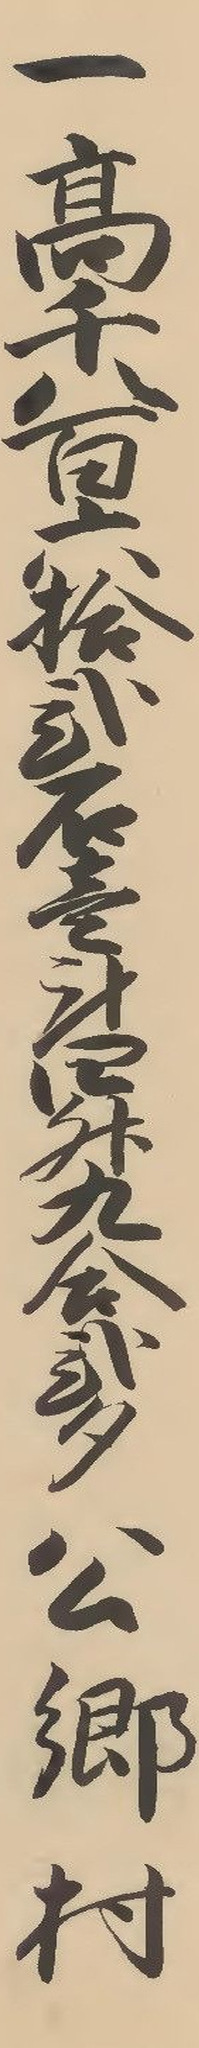一高千八百六拾弐石壱斗四升九合弐勺公郷村

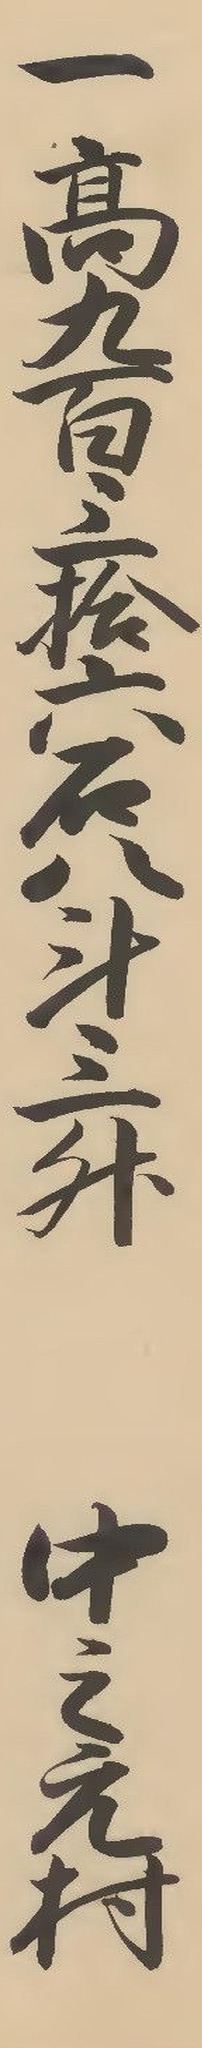一高九百三拾六石八斗三升中之元村
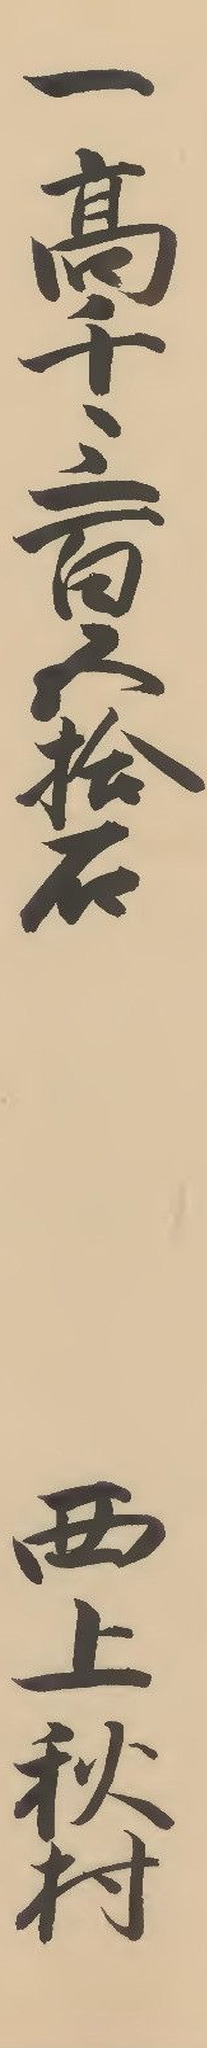一高千三百五拾石西上秋村
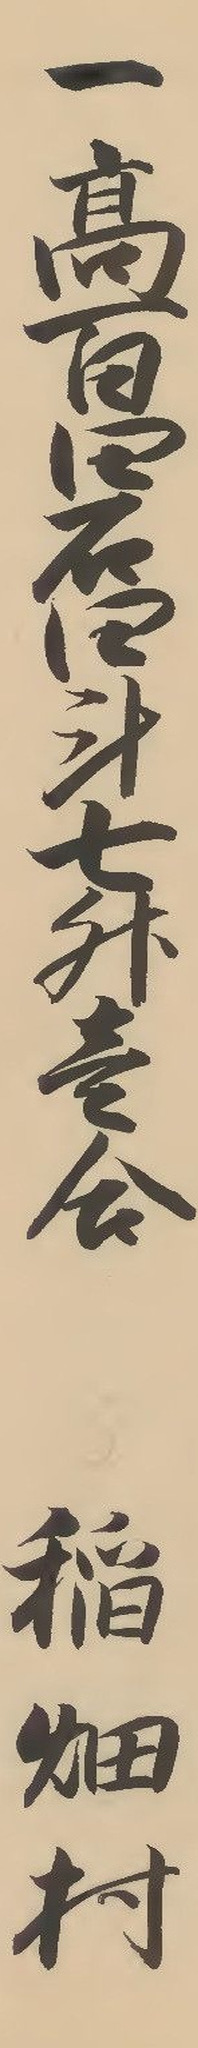一高百四石四斗七升壱合稲畑村
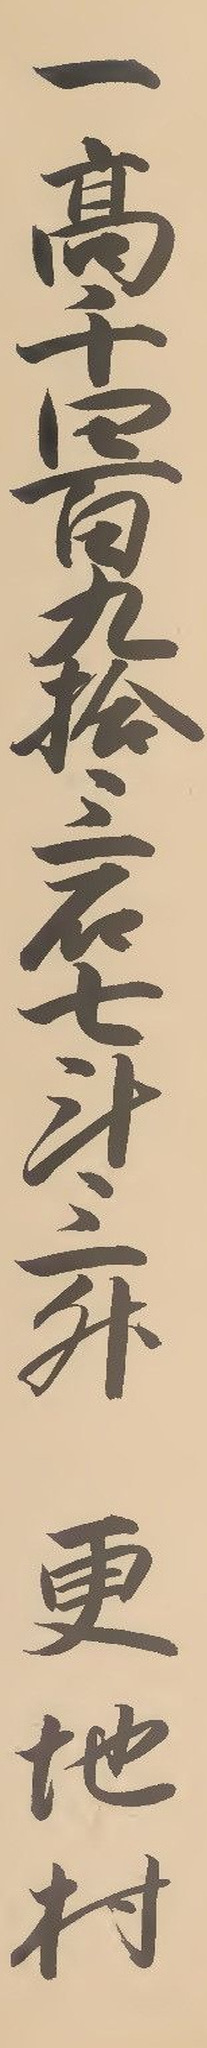一高千四百九拾三石七斗三升更地村
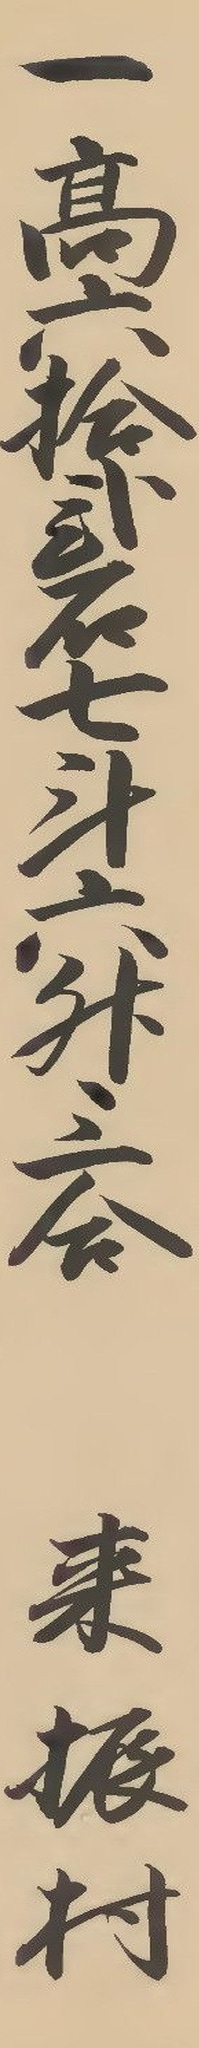一高六拾弐石七斗六升三合来振村

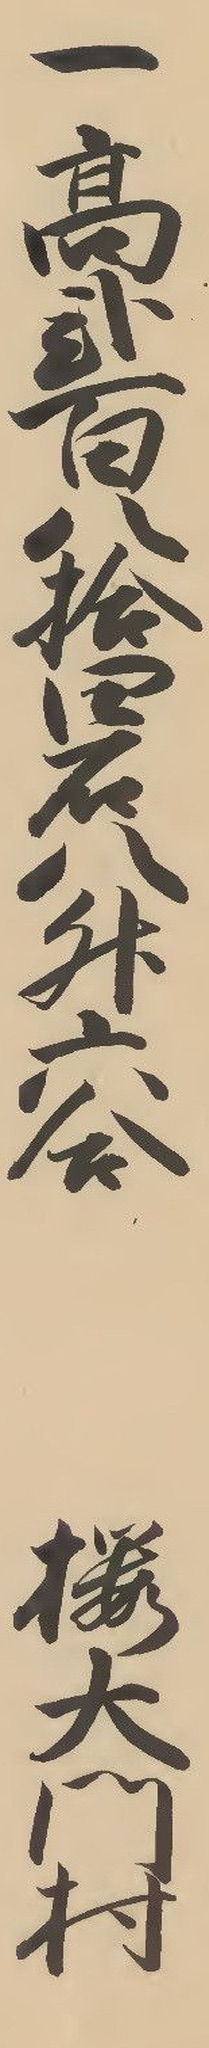一高弐百八拾四石八升六合桜大門村
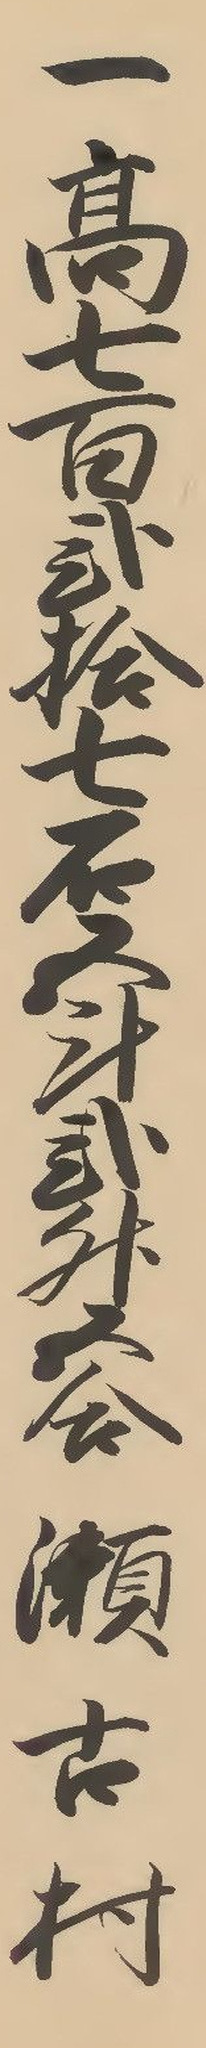一高七百弐拾七石五斗弐升五合瀬古村
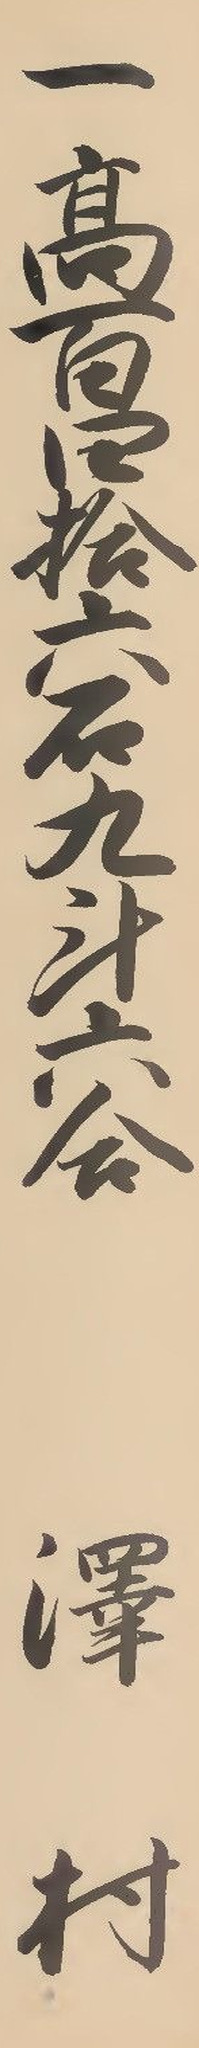一高百四拾六石九斗六合沢村
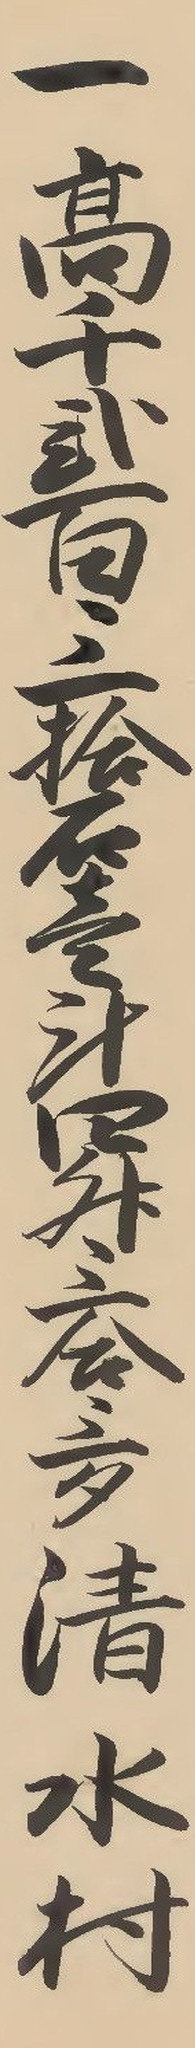一高千弐百三拾石壱斗四升三合三勺清水村
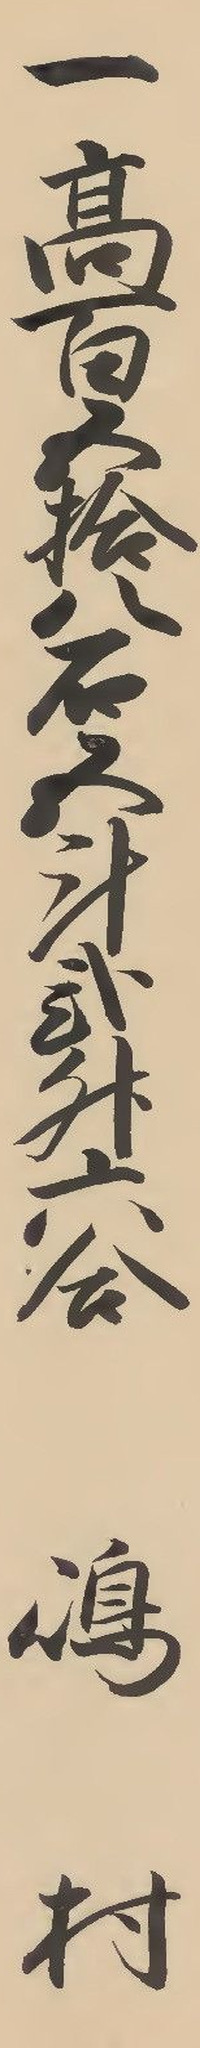一高百五拾八石五斗弐升六合島村
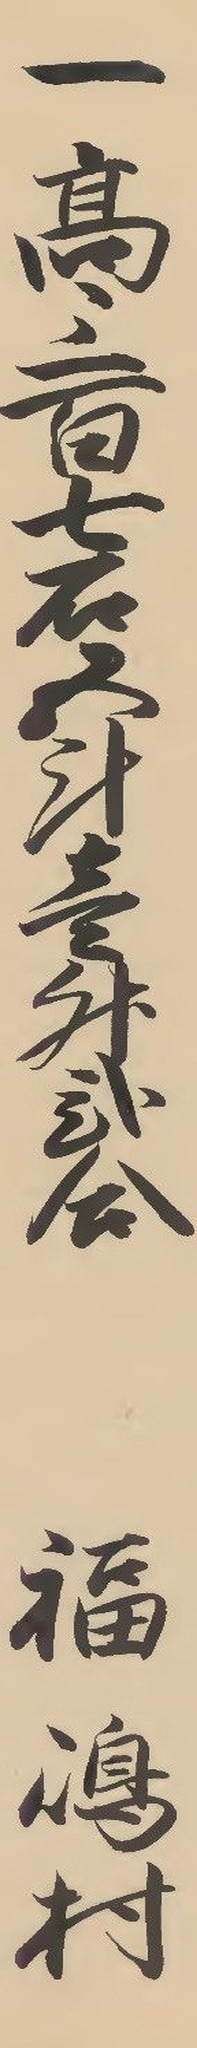一高三百七石五斗壱升弐合福島村

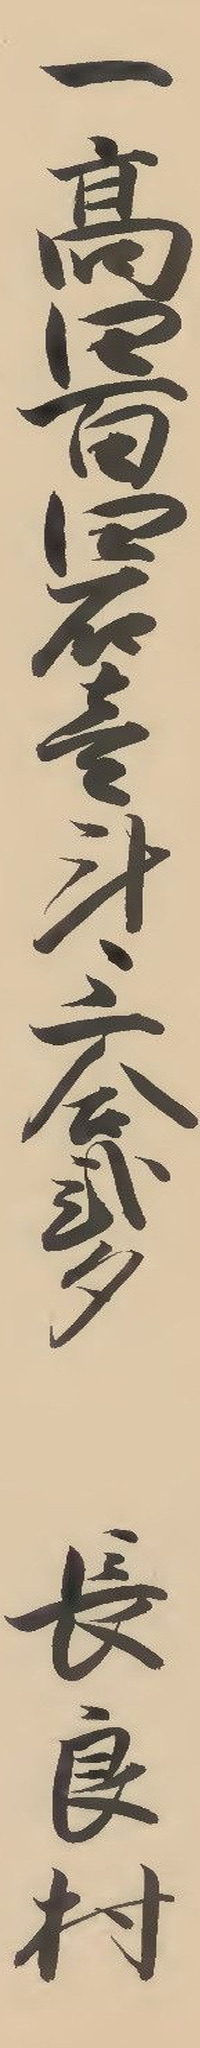一高四百四石壱斗三合弐勺長良村
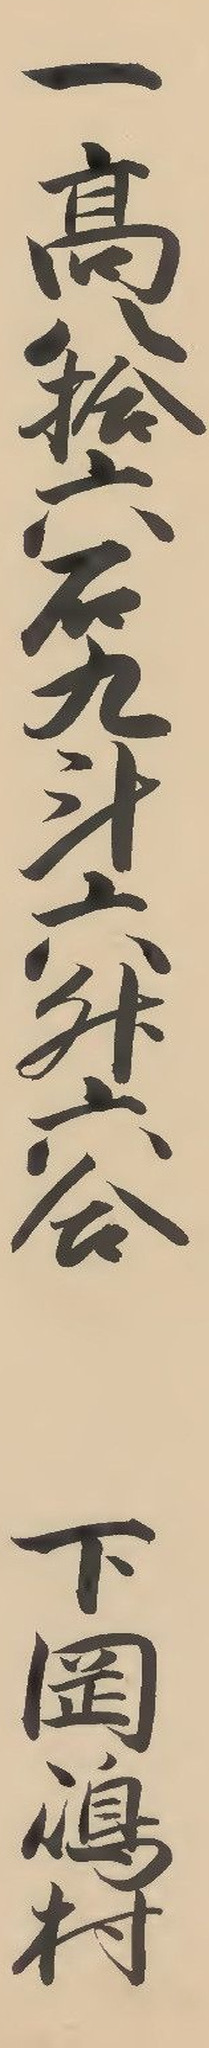一高八拾六石九斗六升六合下岡島村
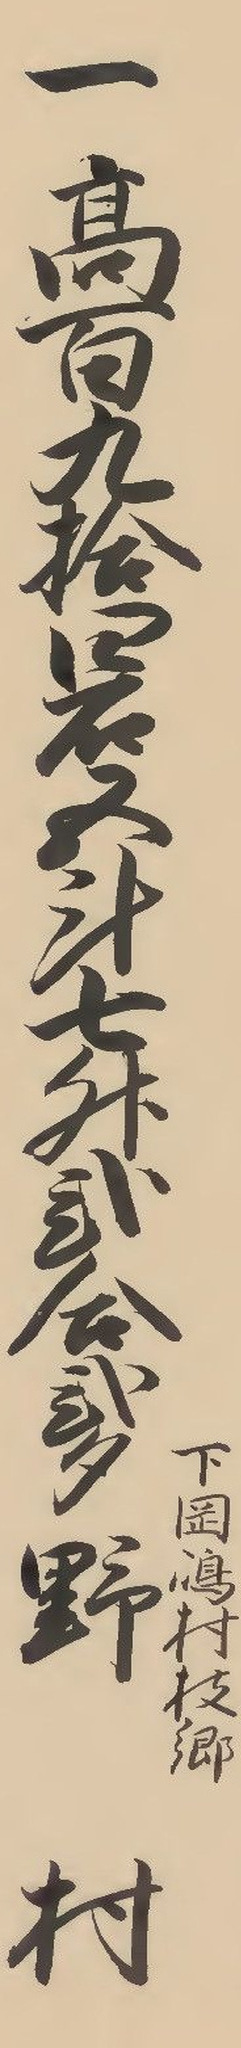一高千六百五拾三石五斗八升弐合野村
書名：美濃国郷帳
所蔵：国立公文書館 National Archives of Japan
